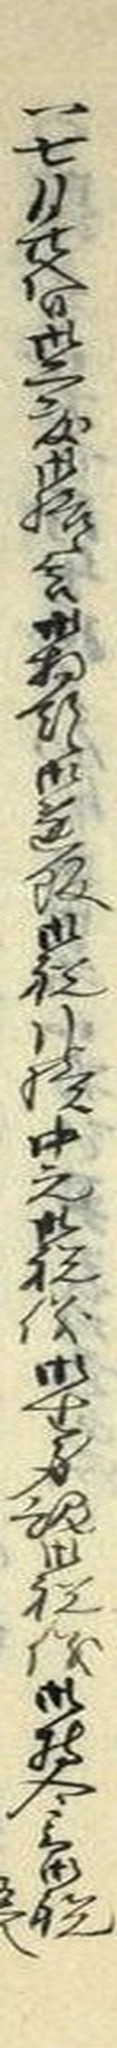一七月廿八日御二度御膳之節御拝領之御蓮飯御祝引続中元御祝儀御生身魂御祝儀御待合ニ而御祝有之
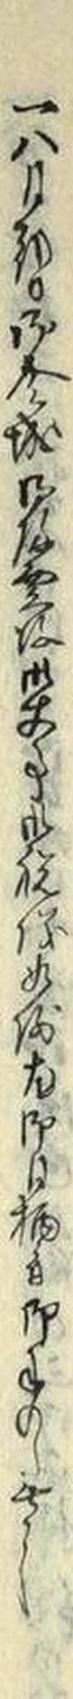一八月朔日御登城御帰殿後御使事御祝儀如例尤御日柄ニ付御手のし無之
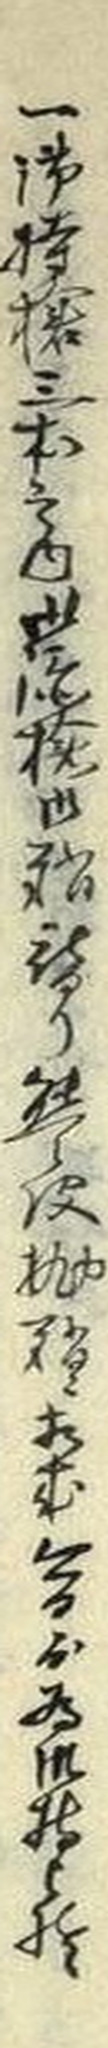一御持槍三本之内御添槍御鞘替り熊之皮抛鞘ニ相成今日ゟ為御持被遊候
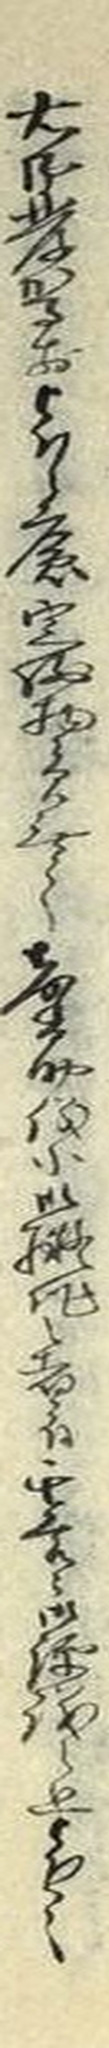右御発駕前被下之廉定例物ニ而ハ無之馨助儀小擬作之者ニ付其節ニ御評議之上被下之
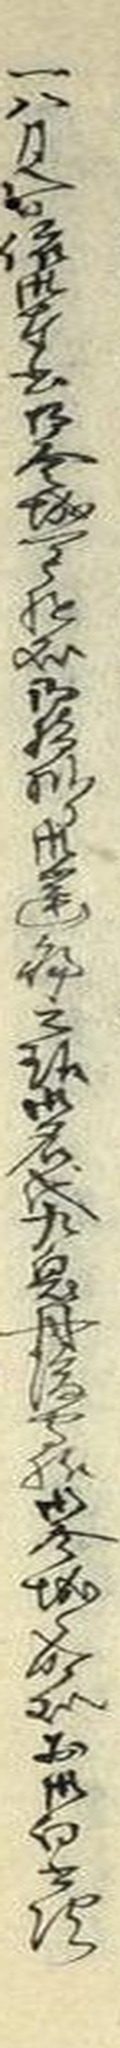一八月八日依御奉書御登城可被遊処御指掛り御歯痛之趣御名代九鬼丹後守様御登城被成候所於御白書院
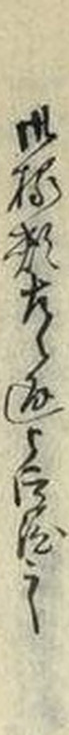御縁頬左之通被仰渡之御名
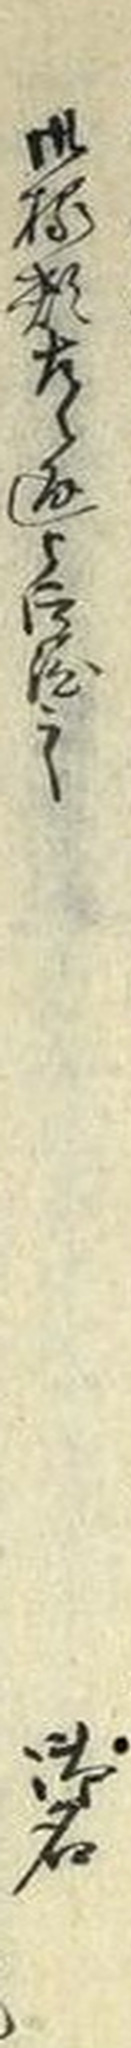御縁頬左之通被仰渡之御名
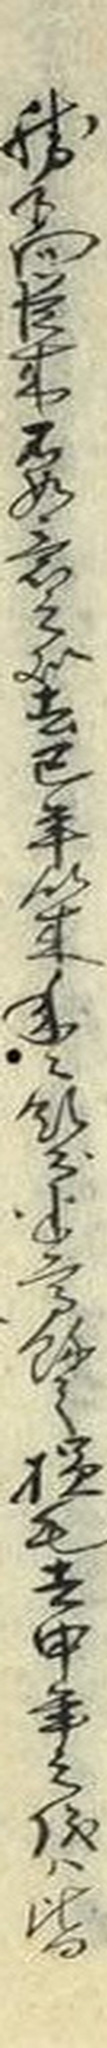勝手向従来不如意之処去巳年以来年々領分半高余之損毛去申年之儀ハ皆
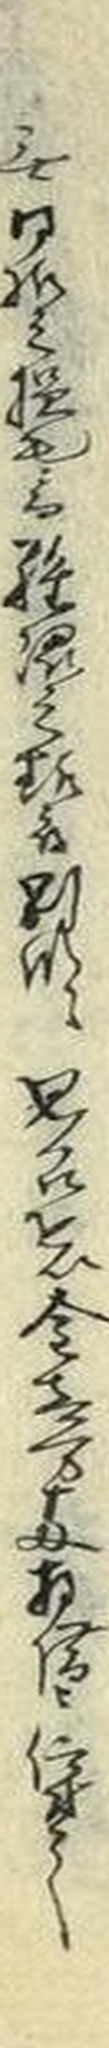無同様之損毛ニ而難渋之趣ニ付別段之思召を以金壱万両拝借被仰付之
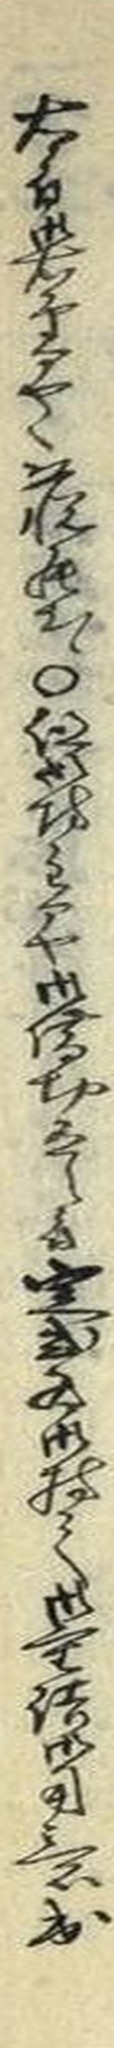右ニ付御右筆部屋へ恐悦罷出候〇但御坊主部屋御借切有之ニ付定式為御持之御重詰御用意出
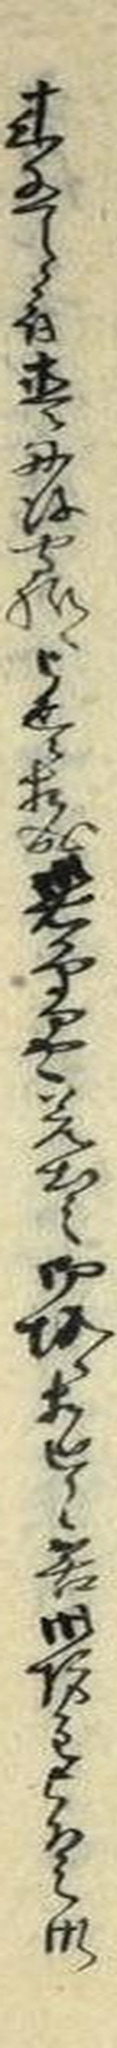来有之ニ付直ニ丹後守様へ被進ニ相成御右筆部屋へ差出之御城へ相廻り候筈御坊主被下之御

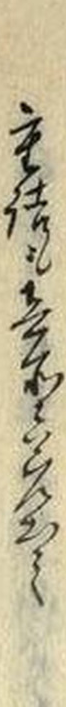重詰も壱所ニ差出之
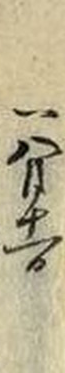一八月十一日
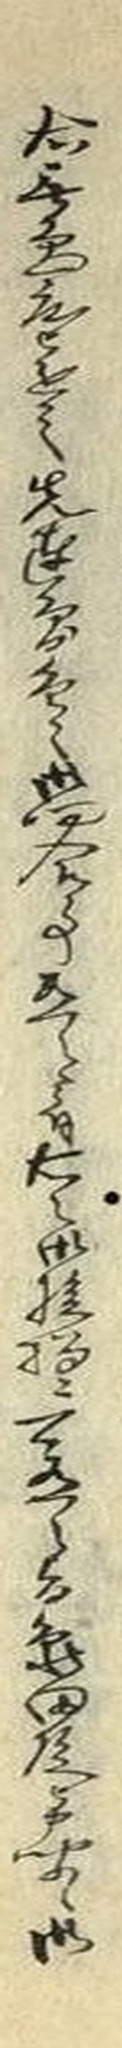右無急度被進之先達而ゟ色々御問合事有之候ニ付右之御挨拶ニ可有之旨亀田殿被申聞候御
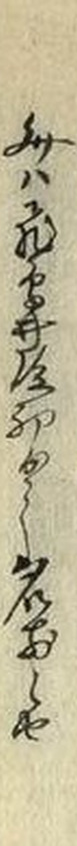文ハ飛鳥井殿初ゟ之名前之由
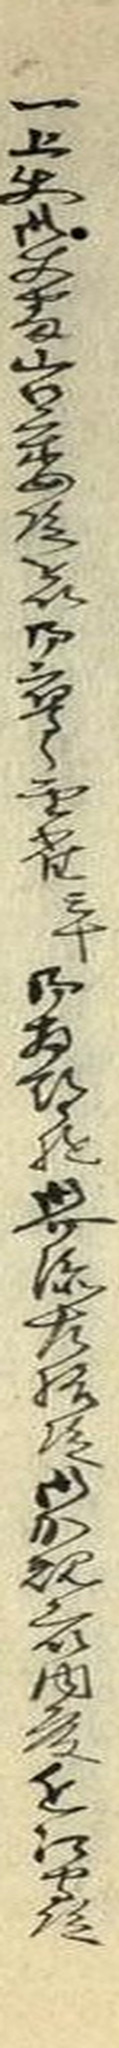一上使御使番山口采女殿を以御鷹之雲雀三十御拝領被遊御介添左膳殿御加規衆内藤近江守殿
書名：少傅日録抄（斉善付側向頭取日記、在府）
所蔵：福井県文書館 Fukui Prefectural Archives
